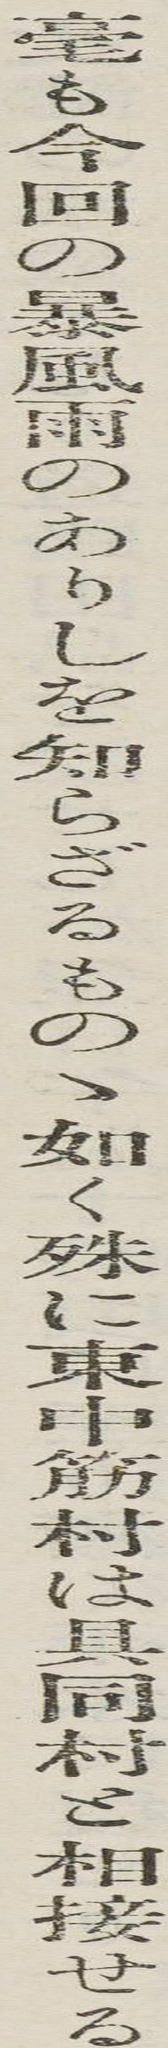蒙も今回の暴風雨のありしを知らざるものゝ如く殊に東中筋村は具同村と相接せる
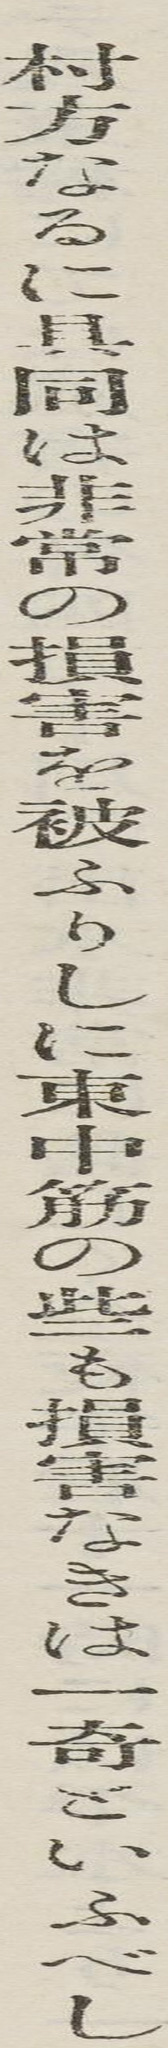村方なるに具同は非常の損害を被ふりしに東中筋の些も損害なきは一奇といふべし
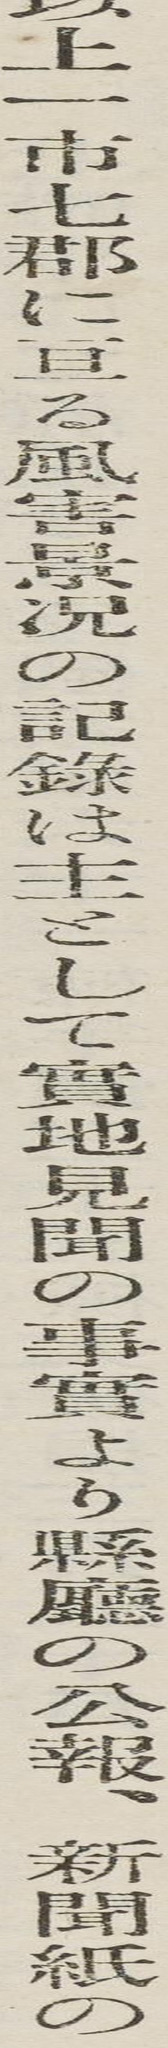以上一市七郡に亘る風害景況の記録は主として実地見聞の事実より県庁の広報、新聞紙の
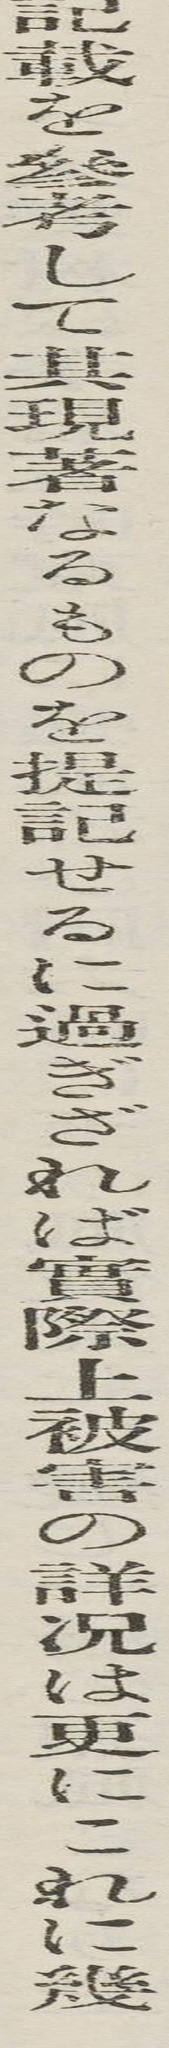記載を参考して其現著なるものを提記せるに過ぎざれば実際上被害の詳況は更にこれに幾
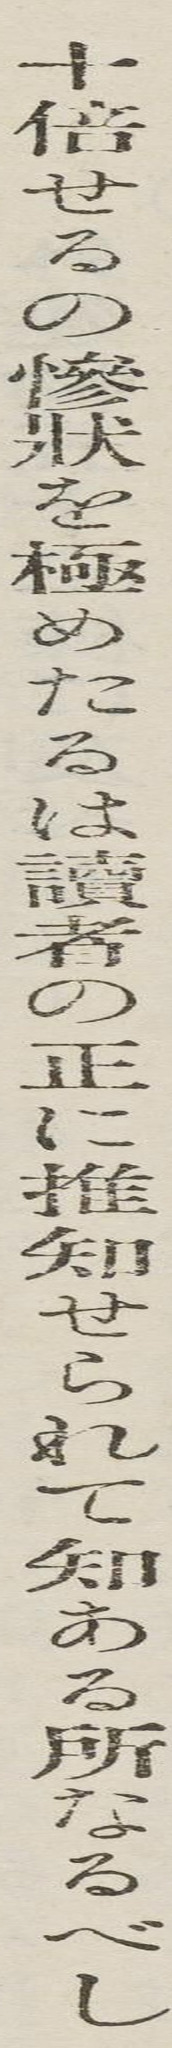十倍せるの惨状を極めたるは読者の正に推知せられて知ある所なるべし
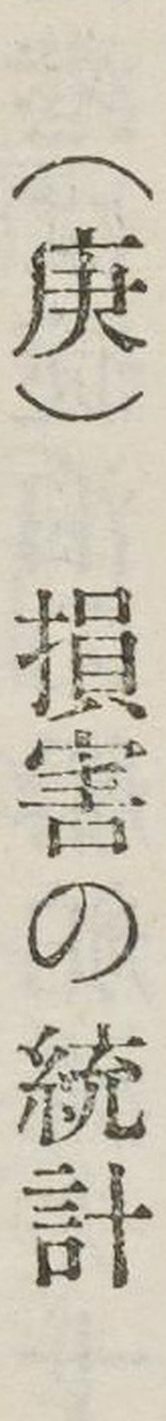損害の統計
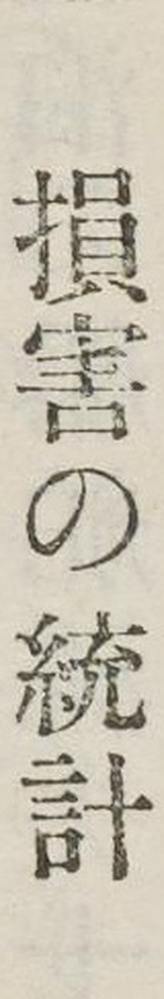損害の統計
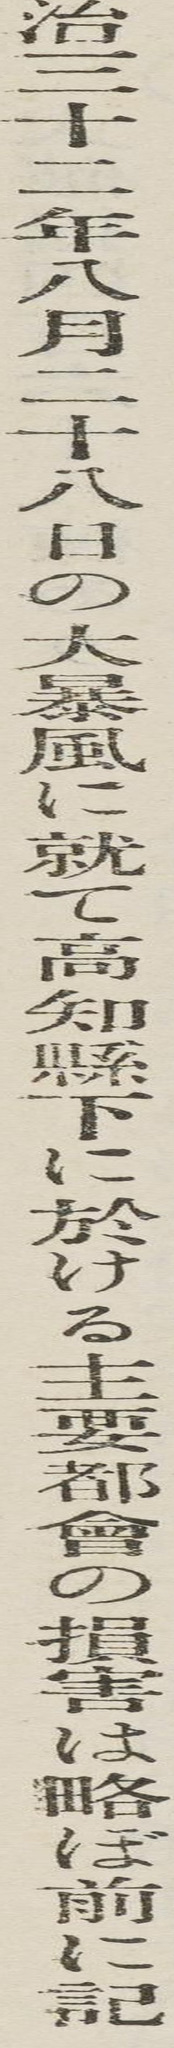明治三十二年八月二十八日の大暴風に就て高知県下に於ける主要都会の損害は略ぼ前に記
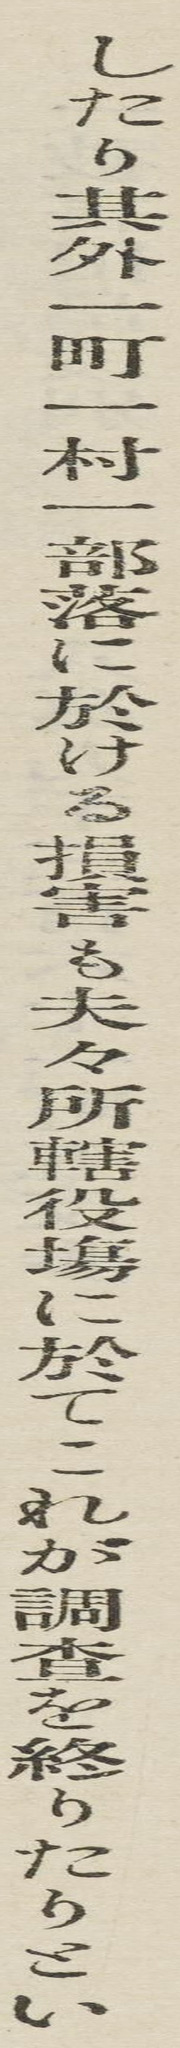したり其外一町一村一部落に於ける損害も夫々所轄役場に於てこれが調査を終りたりとい
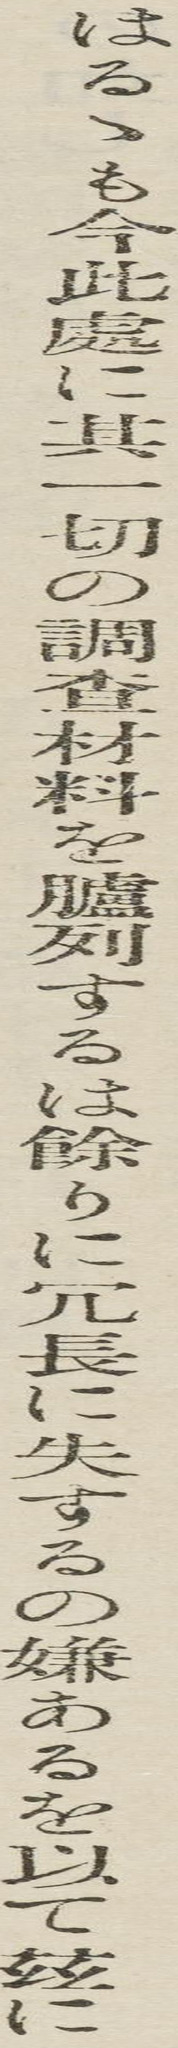はるゝも今此処に其一切の調査材料を臚列するは余りに冗長に失するの嫌あるを以て茲に
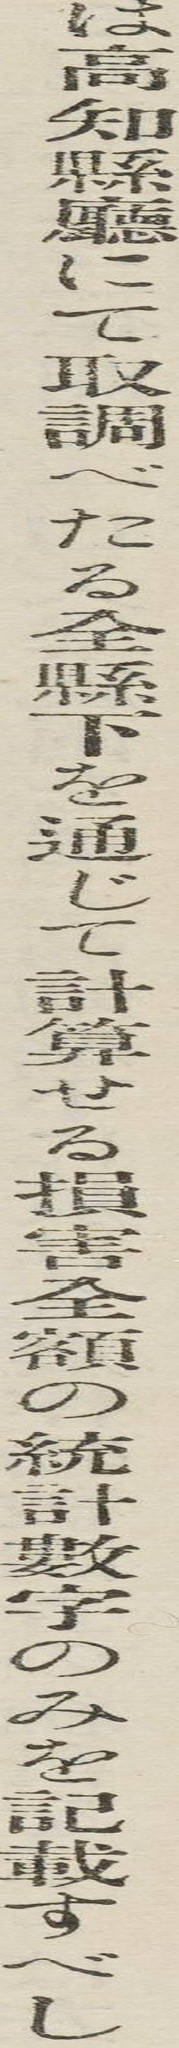は高知県庁にて取調べたる全県下を通じて計算せる損害全額の統計数字のみを記載すべし
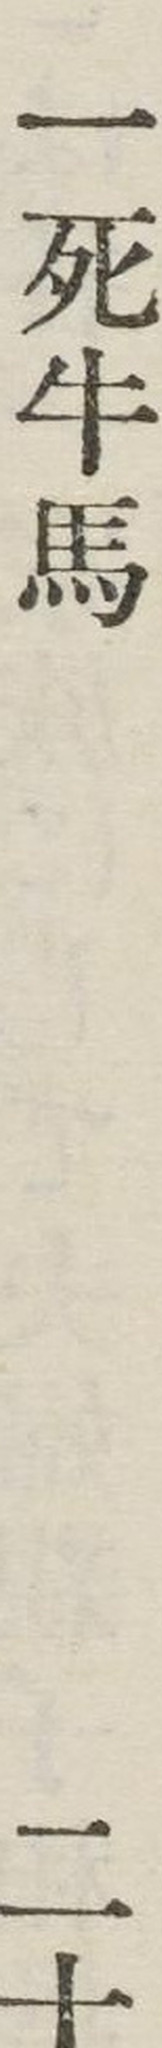一死牛馬二十頭
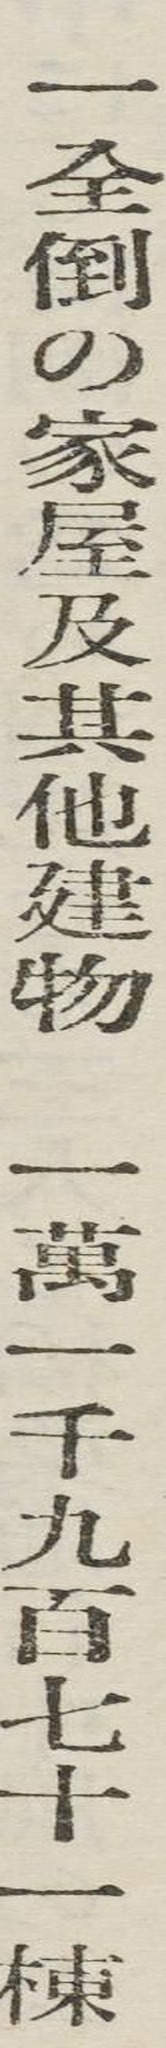一全倒の家屋及其他建物一万一千九百七十一棟
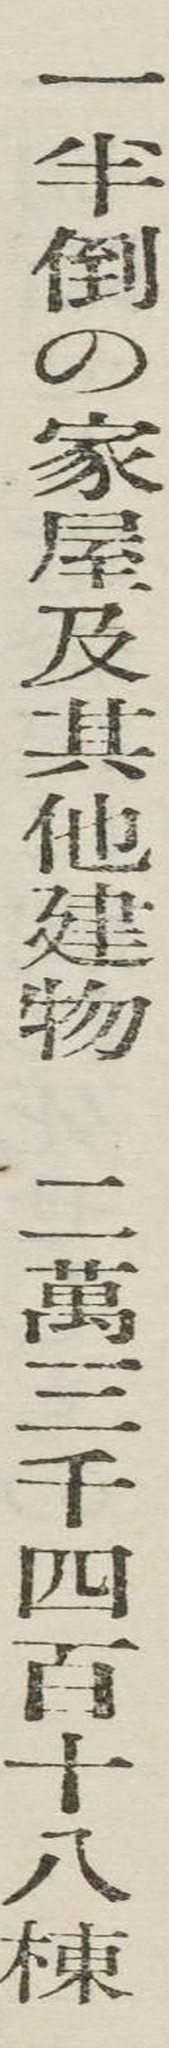一半倒の家屋及其他建物二万三千四百十八棟
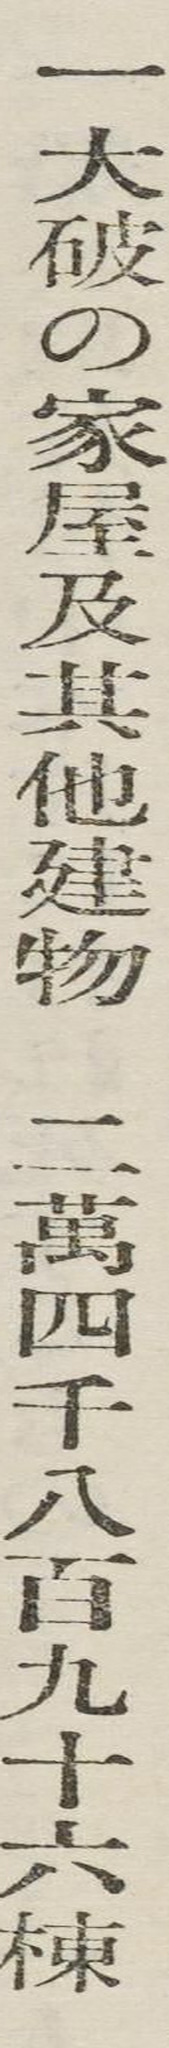一大破の家屋及其他建物二万四千八百九十六棟
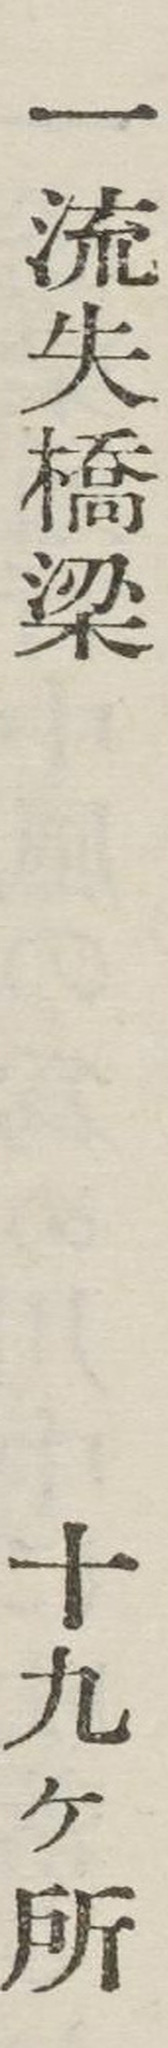一流失橋梁十九ケ所
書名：土佐古今ノ地震
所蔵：東京大学地震研究所図書室 Earthquake Research Institute Library, The University of Tokyo, JAPAN
